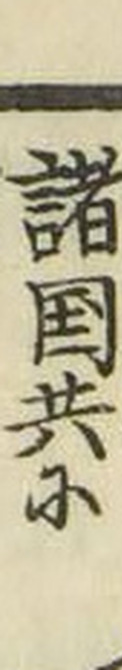諸国共に
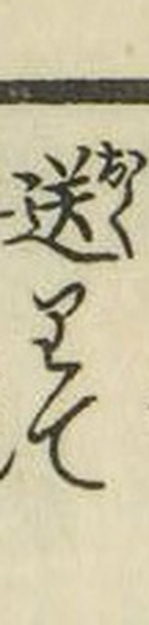送りて
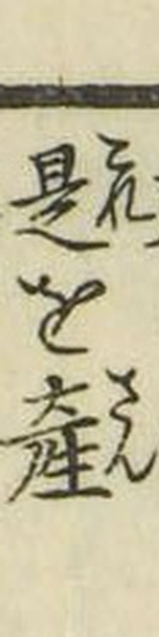是を産
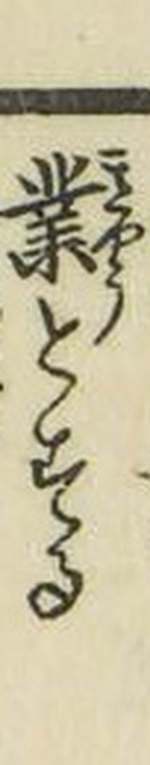業とする
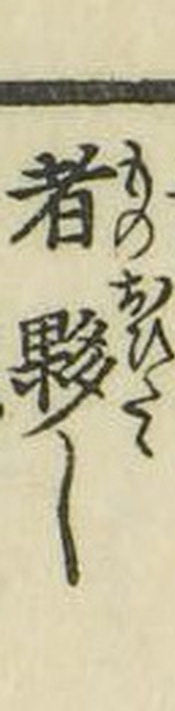者夥し
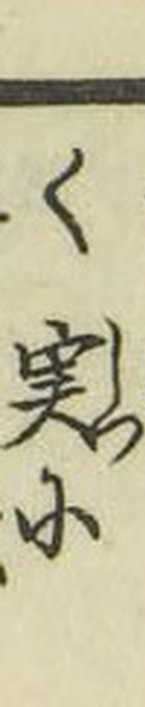く実に
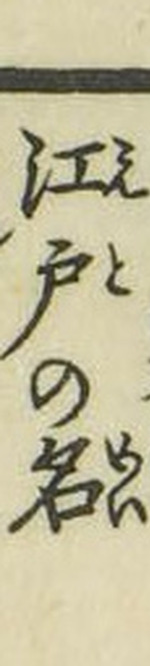江戸の名
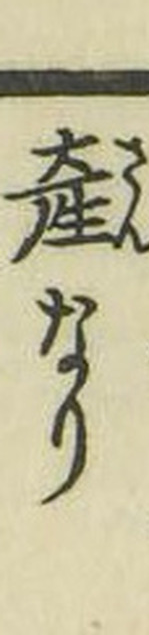産なり

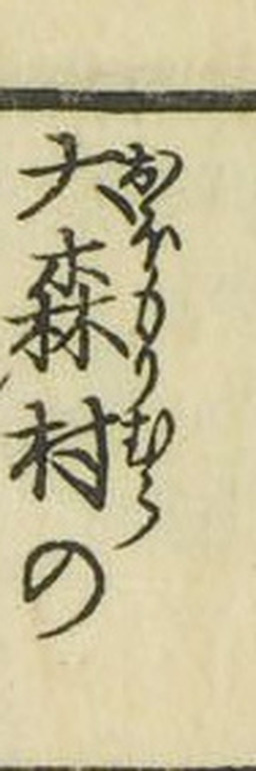大森村の
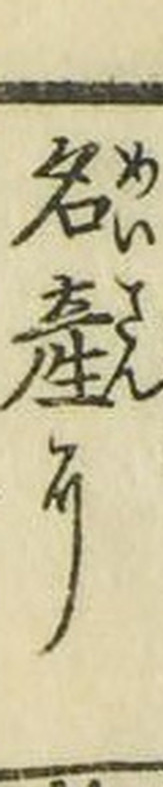名産に
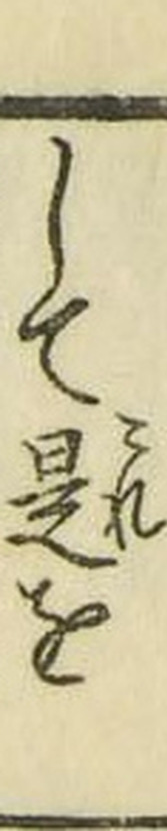して是を
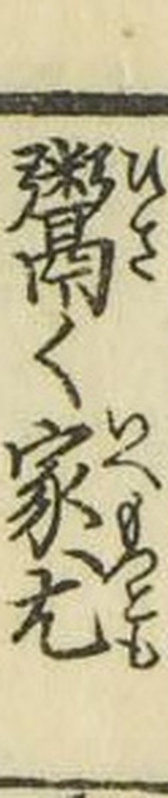鬻く家尤
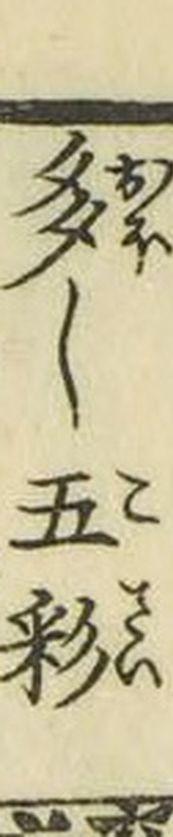多し五彩
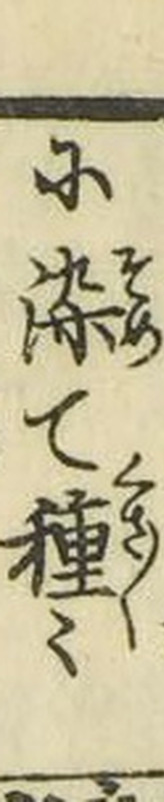に染て種々
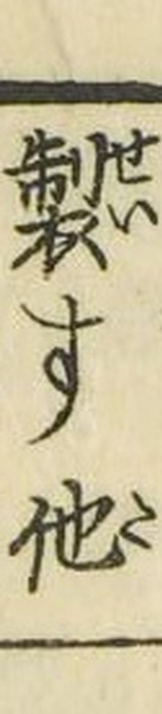製す他
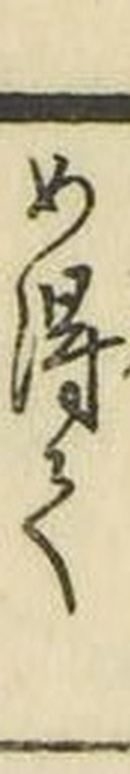め得て
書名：江戸名所図会 20巻 巻之4
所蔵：東京学芸大学教育コンテンツアーカイブ
